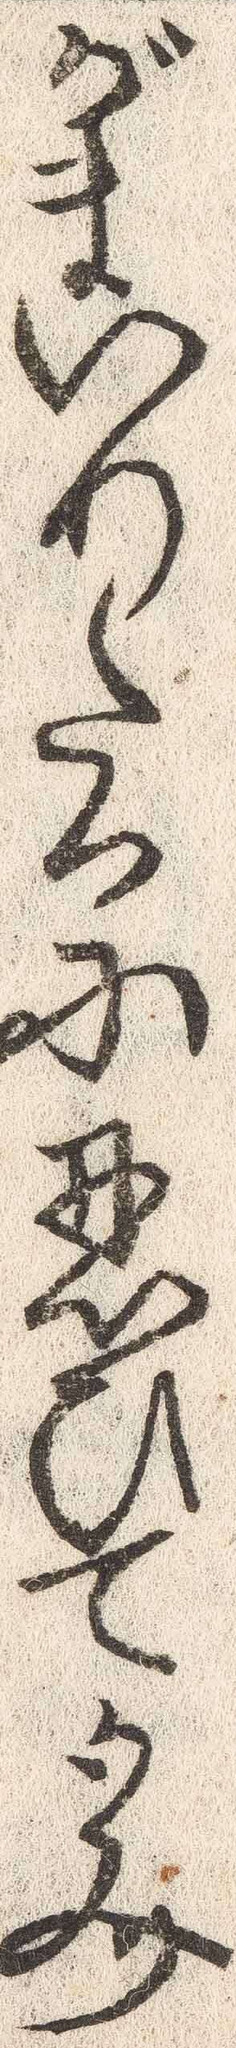がまいりたるに忍ひて御文
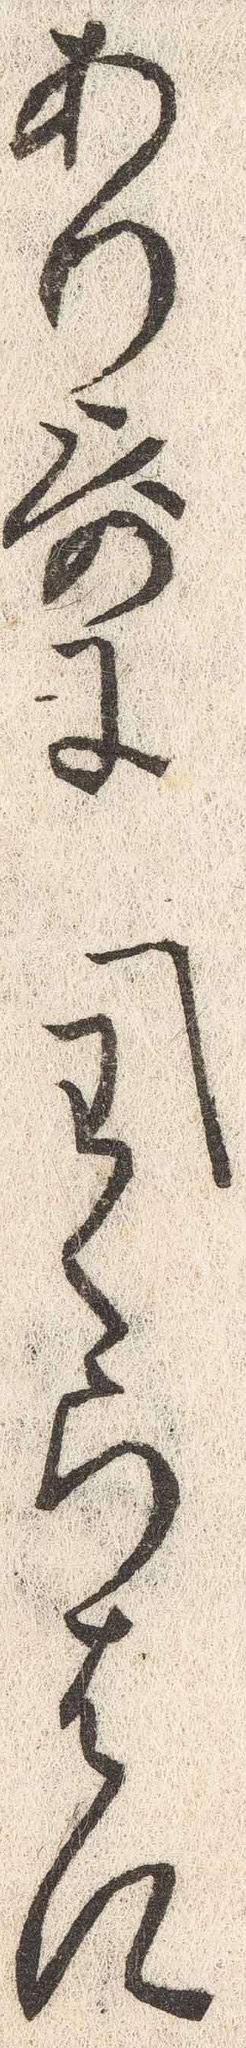あり歌に〽わくらはに

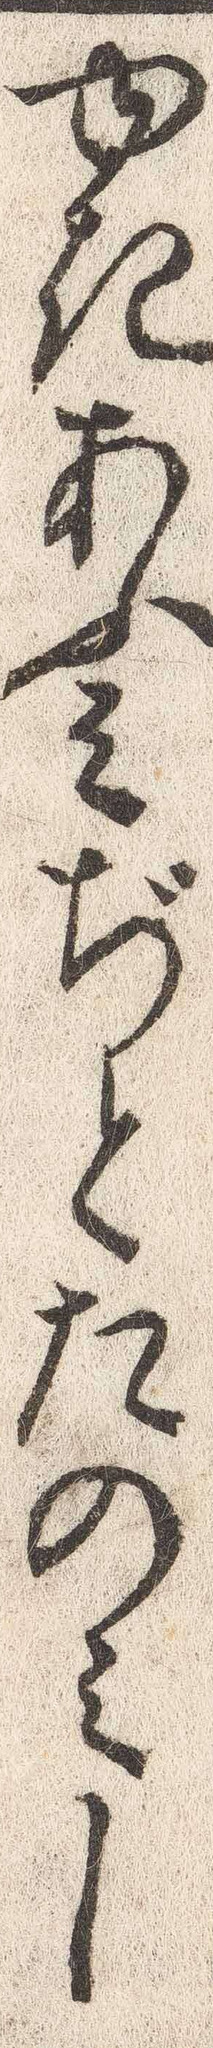ゆきあふみぢとたのみし
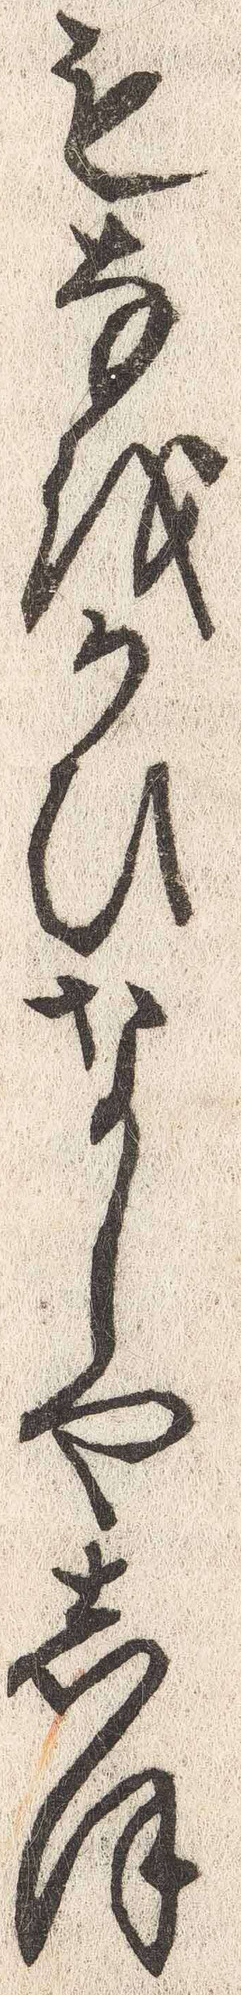もなをかひなしやしほ
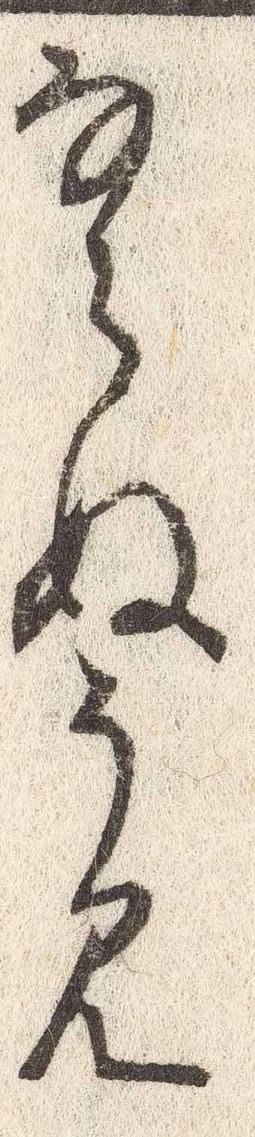ならぬうみ
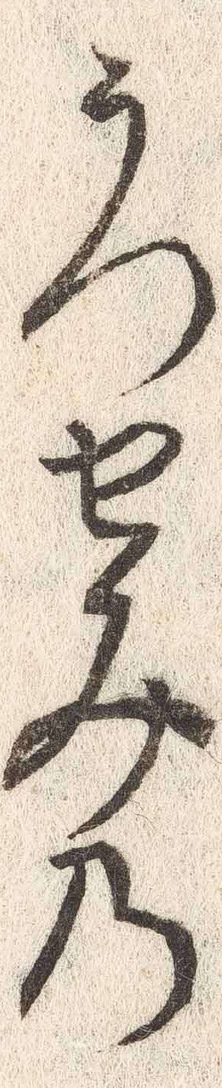うつせみの
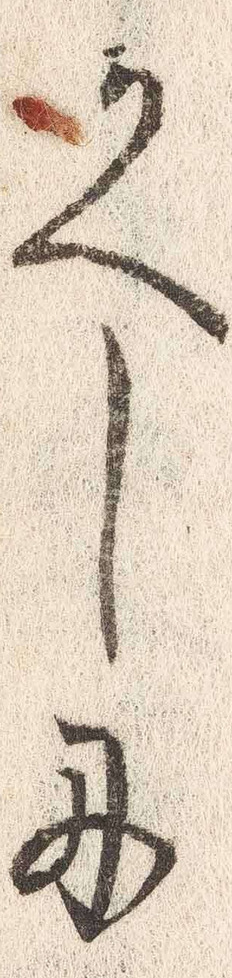かへしに
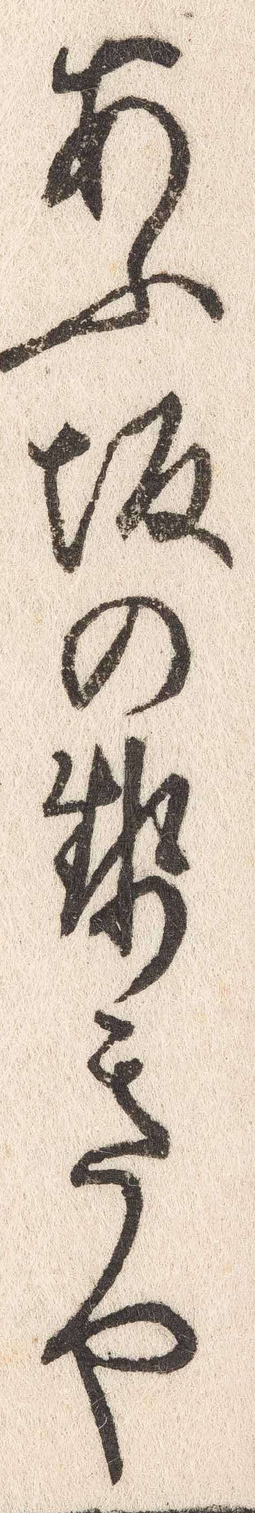あふ坂のせきや
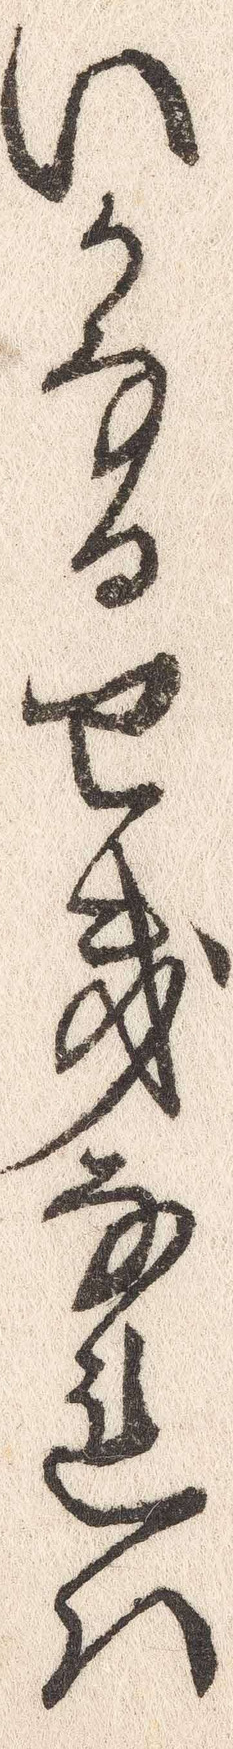いかなるせきなれは
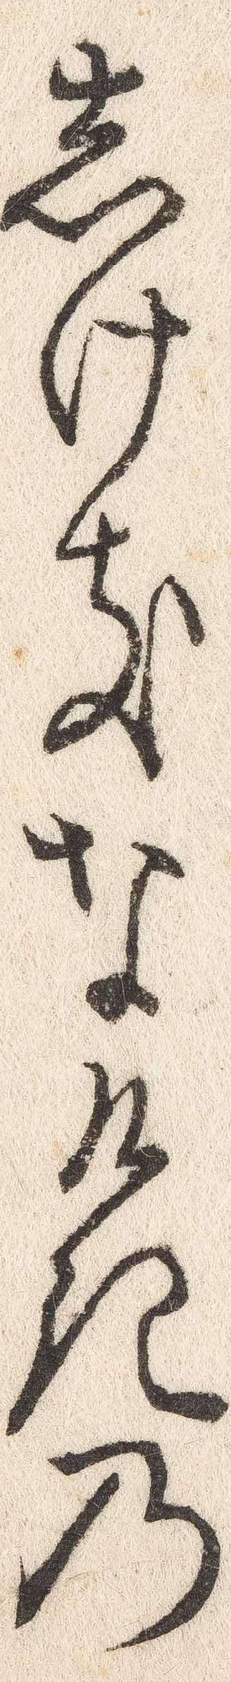しけきなけきの
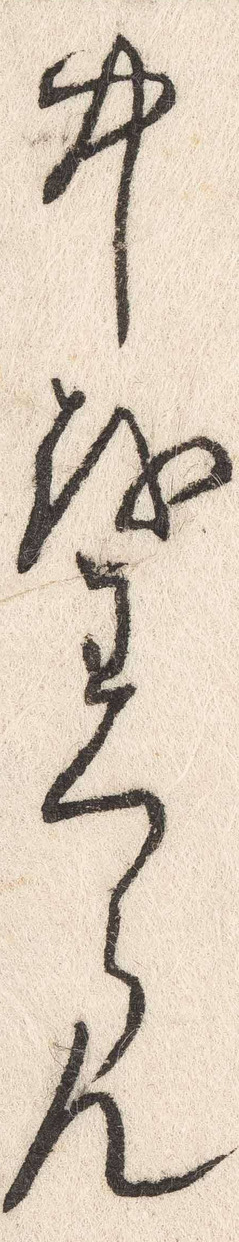中をわくらん

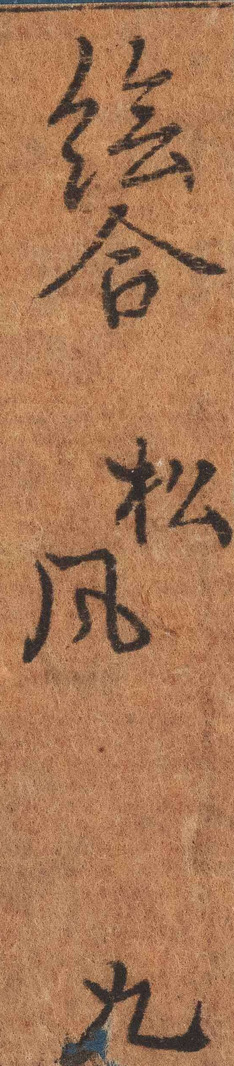絵合松風九

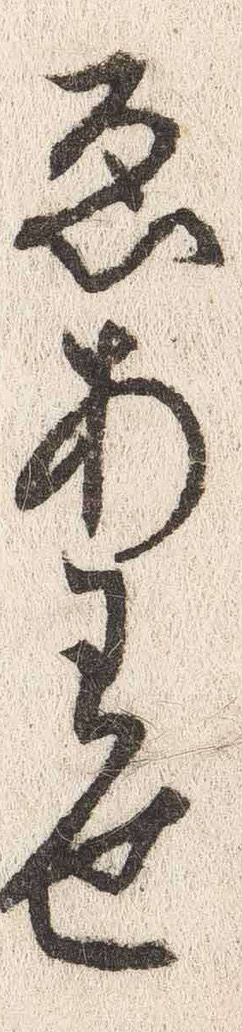ゑあわせ
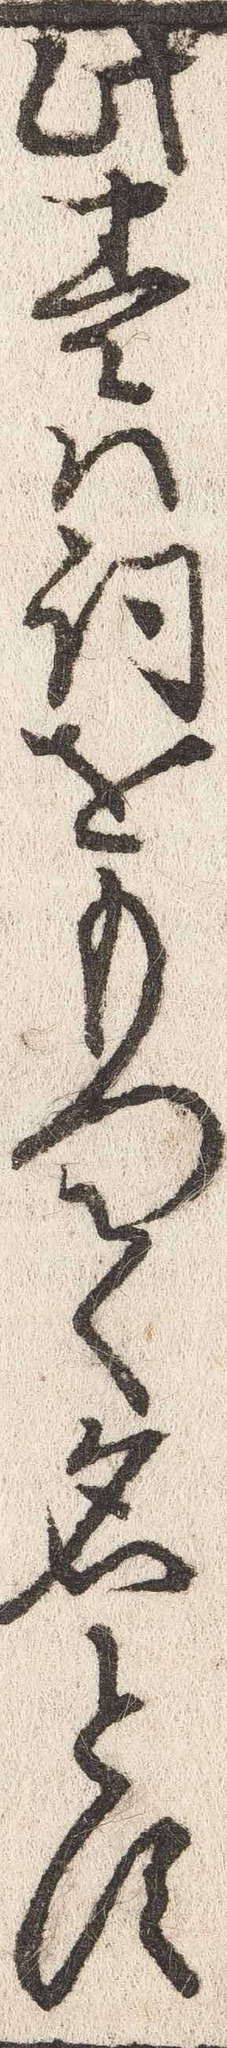此巻は詞をもつて名とす
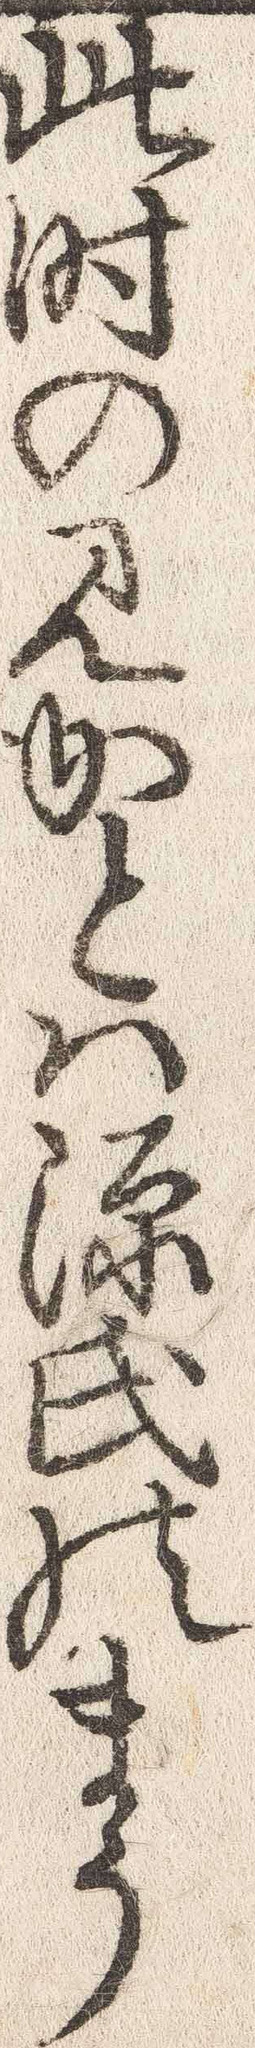此時のみかとは源氏のまう
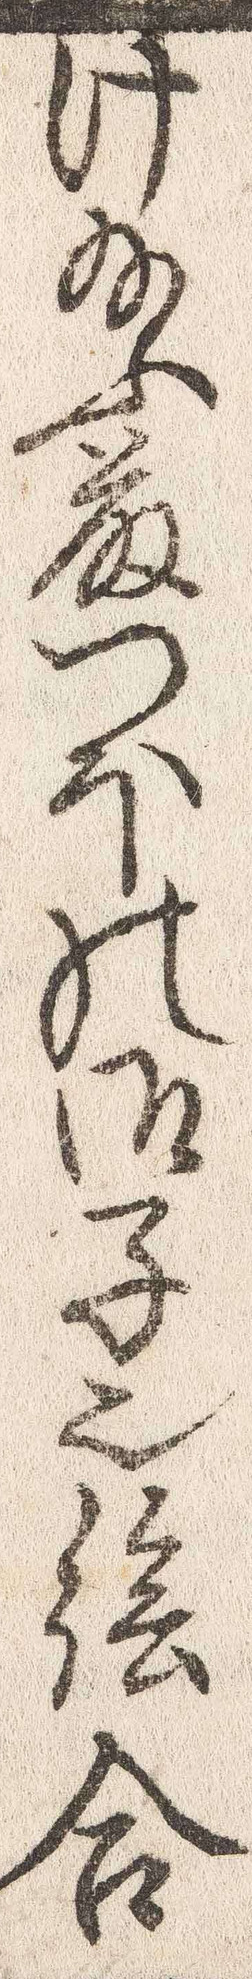け給ふ藤つほの御子也絵合
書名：源氏物語
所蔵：東京学芸大学附属図書館 国文学研究資料館
